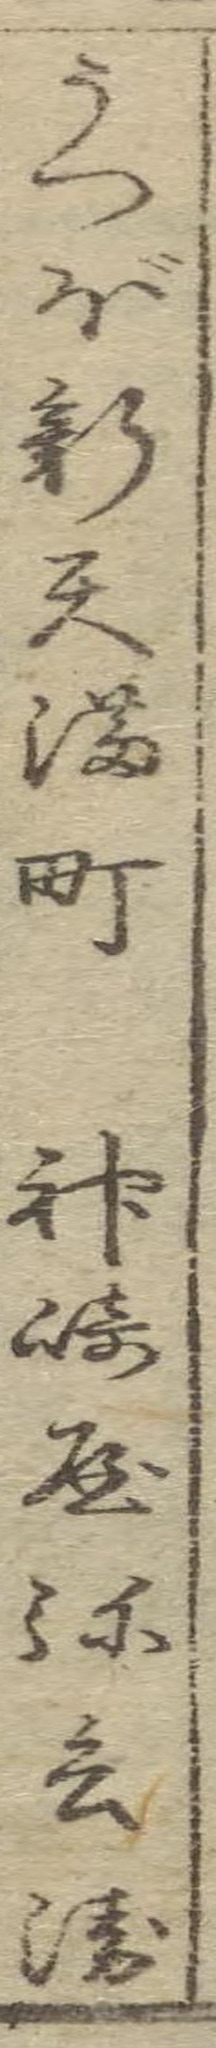うつぼ新天満町神崎屋弥兵衛
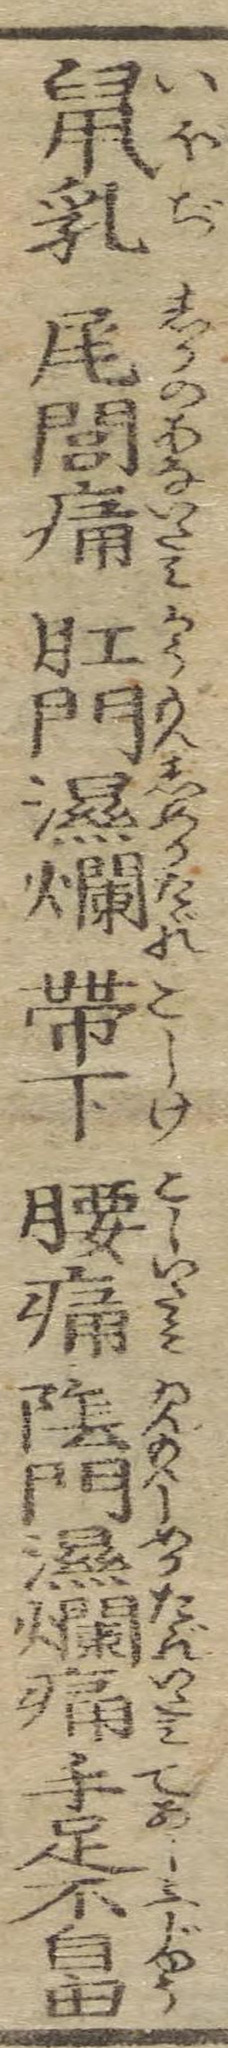鼠乳尾閭痛肛門濕爛帯下腰痛陰門濕爛痛手足不自由
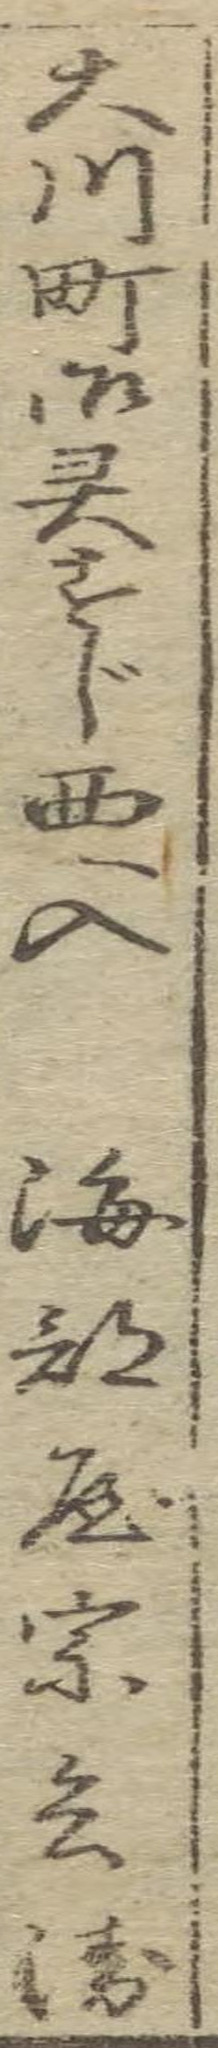大川町御霊すじ西へ入海部屋宗兵衛
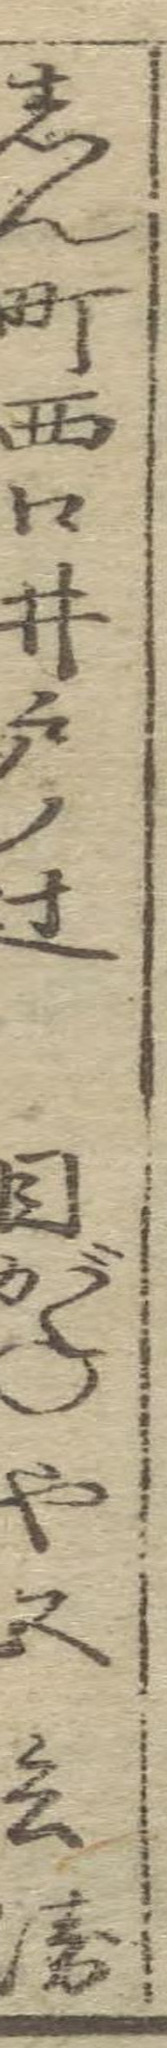しん町西口井戸ノ辻目がねや五兵衛
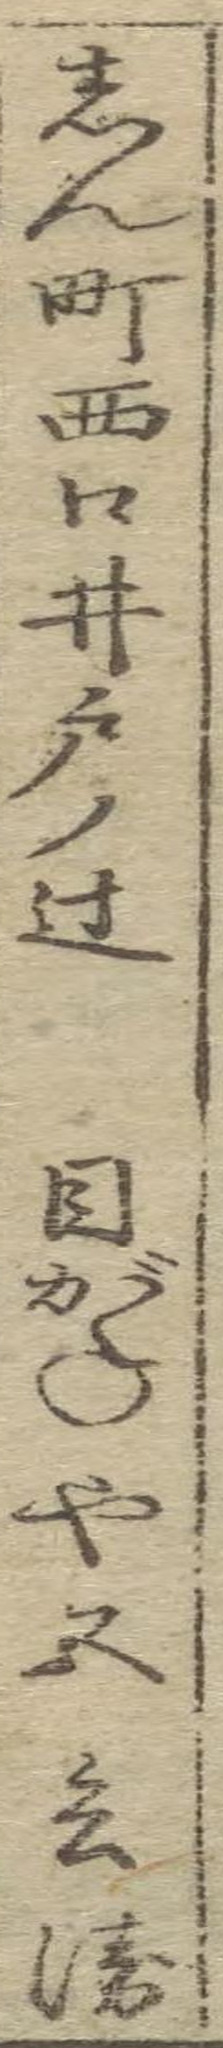しん町西口井戸ノ辻目がねや五兵衛
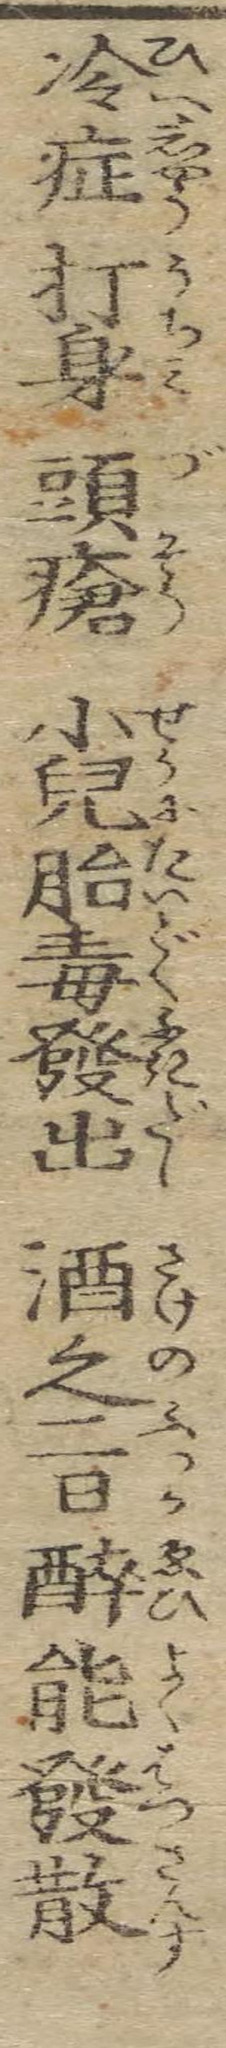冷症打身頭瘡小児胎毒発出酒之二日酔能発散
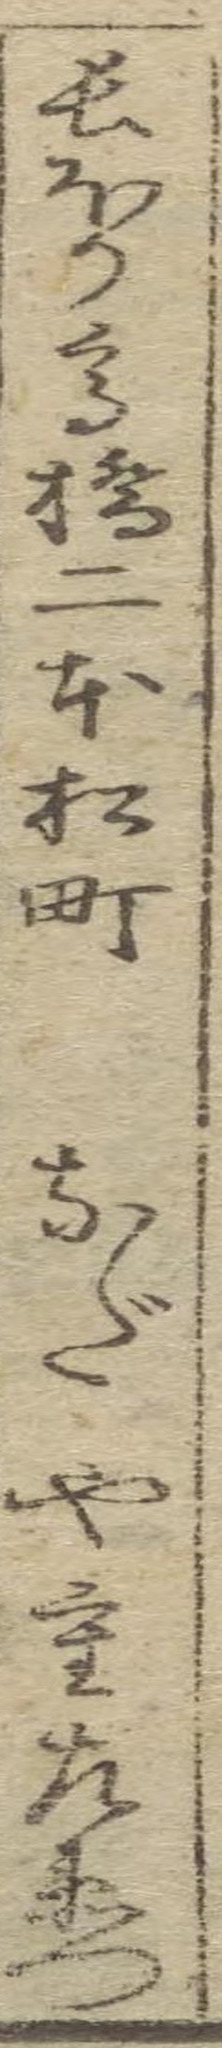長ほり高橋二本松町なだや重左衛門
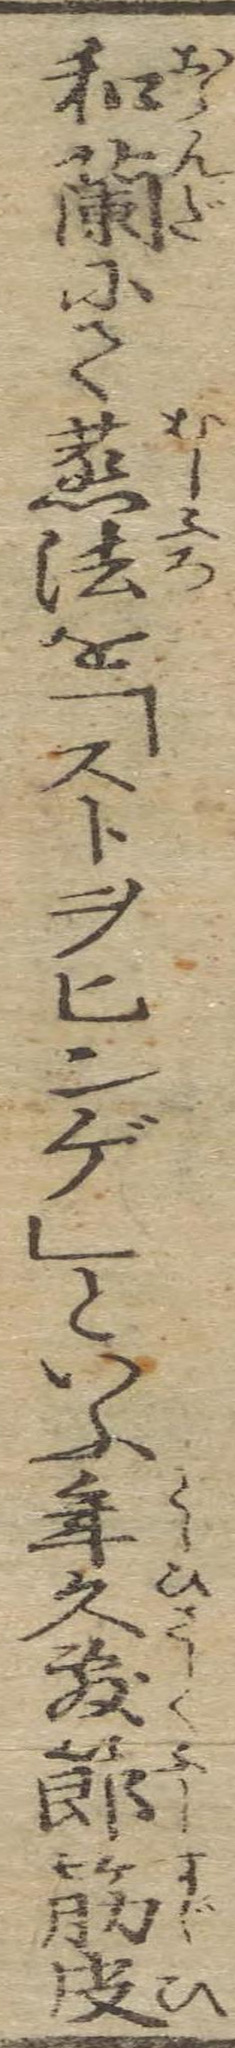和蘭にて蒸法を「ストヲヒンゲ」といふ年久敷節筋皮
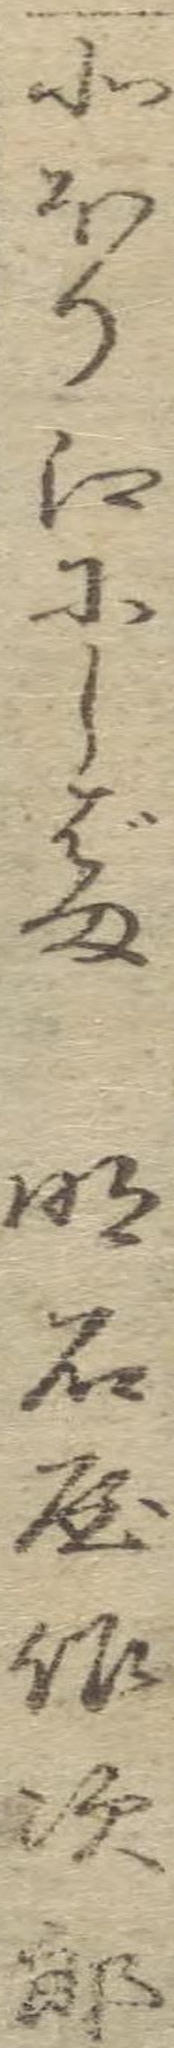北ほり江にしばた明石屋作次郎
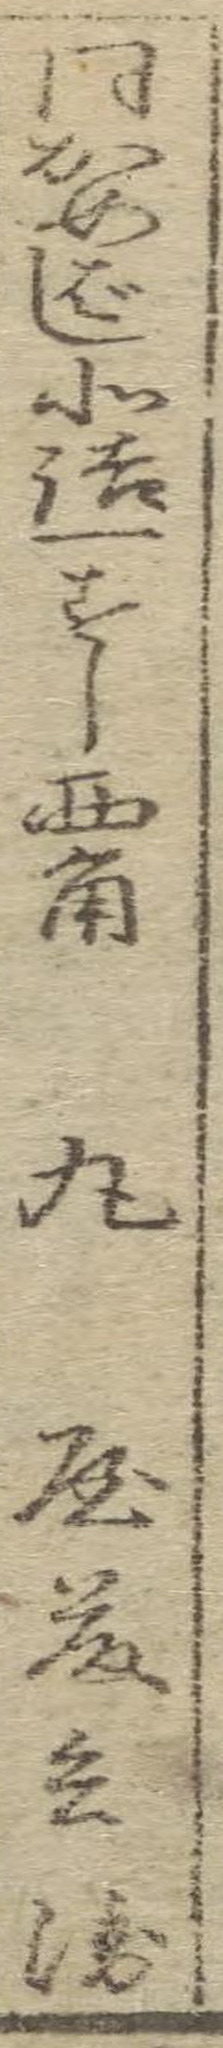同かめばし北詰一すし西角丸屋籐兵衛
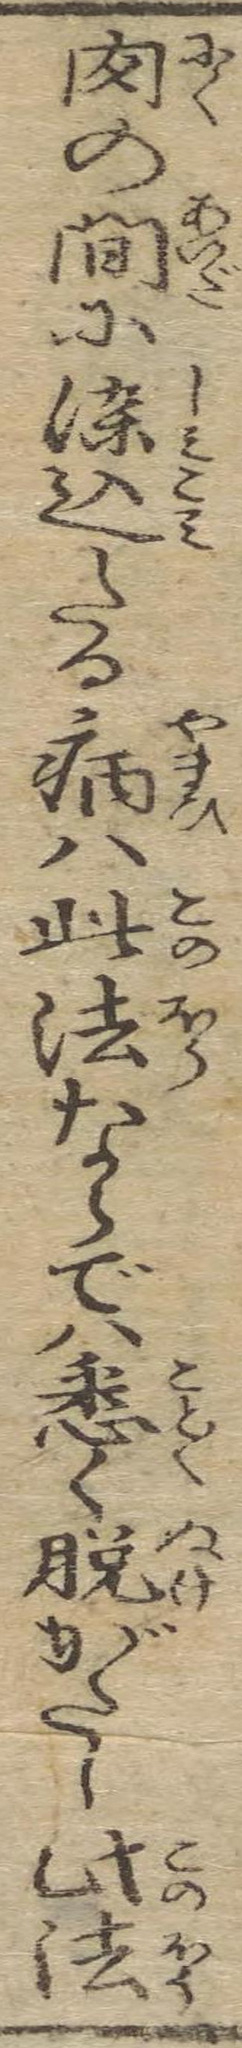肉の間に染込たる病は此法ならでは悉く脱がたし此法
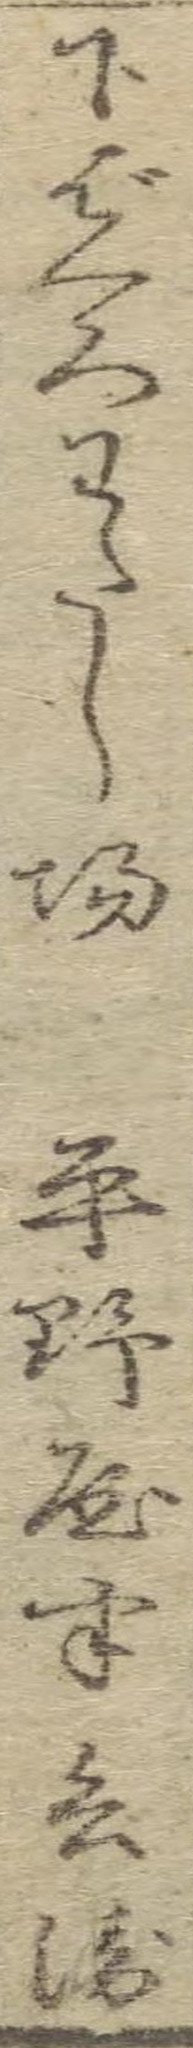下ばくろわたし場平野屋半兵衛
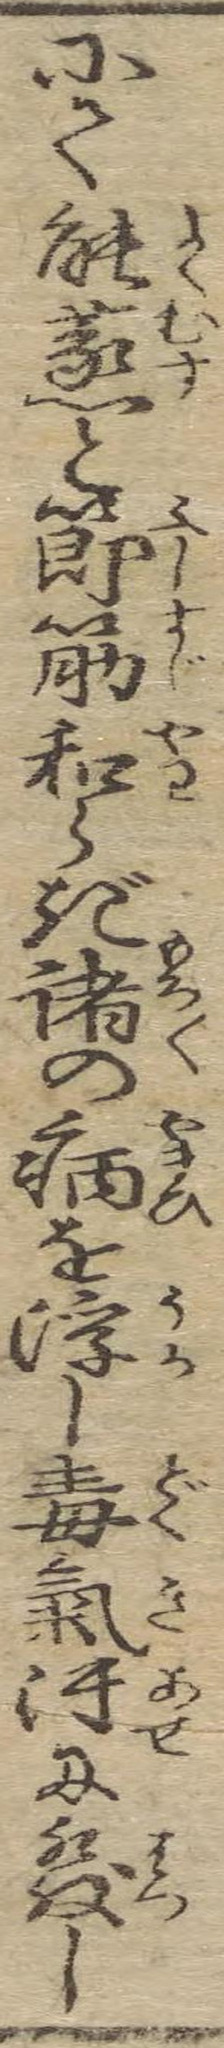にて能蒸と節筋和らぎ諸の病を浮し毒気汗に発し
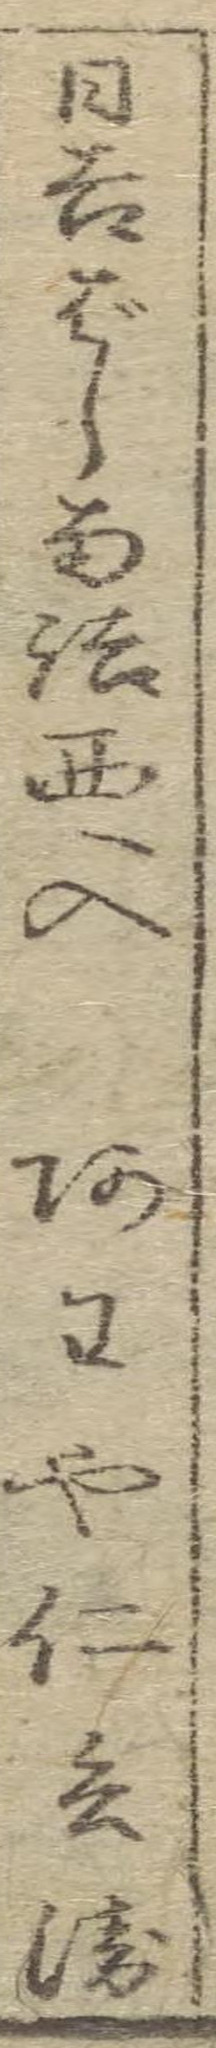日吉ばし南詰西へ入あわや仁兵衛
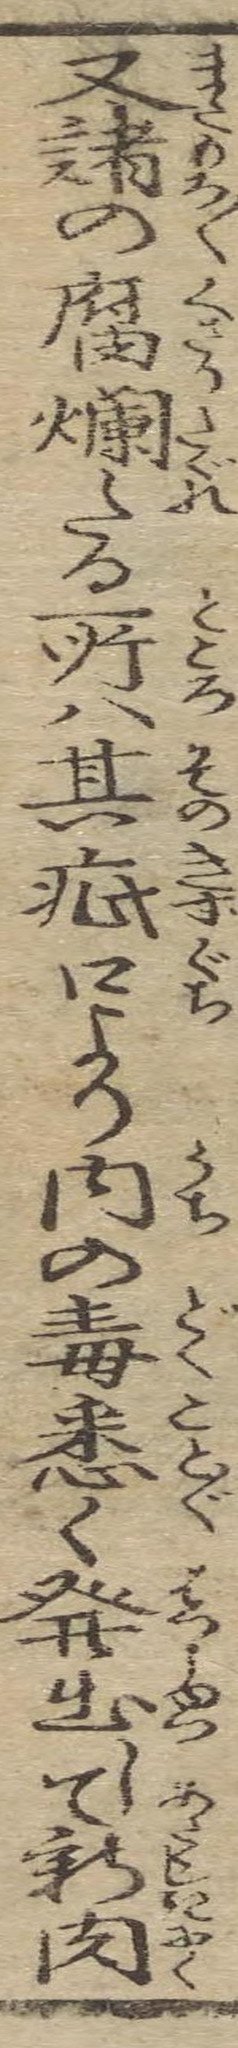又諸の腐爛たる所は其疵口より内の毒悉く発出して新肉
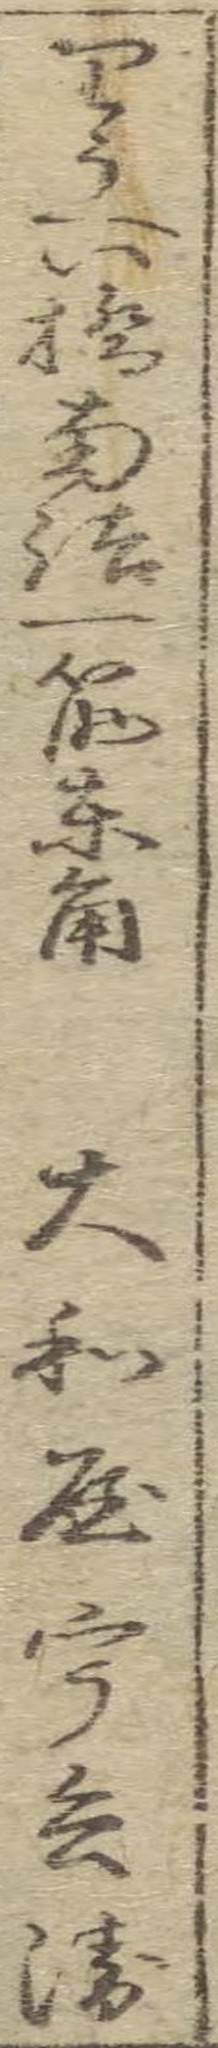りうへい橋南詰一筋東角大和屋宇兵衛
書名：浪華薬種問屋能書張交帖. 二
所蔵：国立国会図書館 National Diet Library, JAPAN
